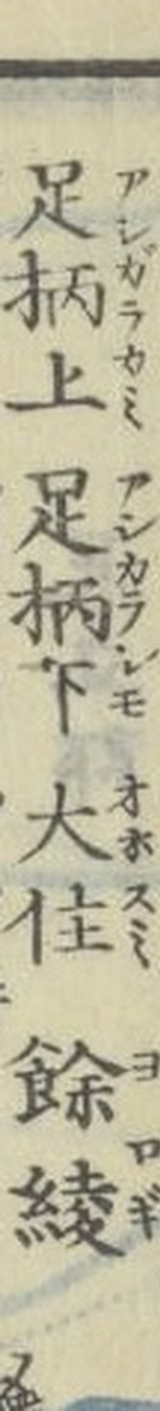足柄上足柄下大住餘綾
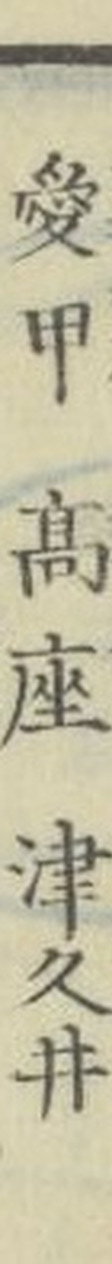愛甲髙座津久井
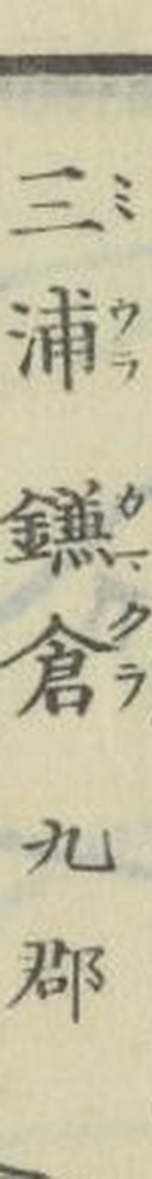三浦鎌倉九郡
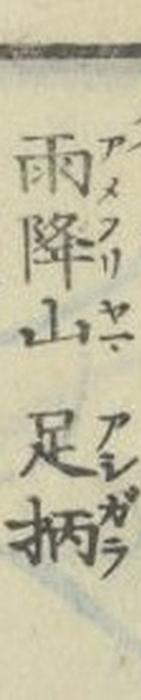雨降山足柄
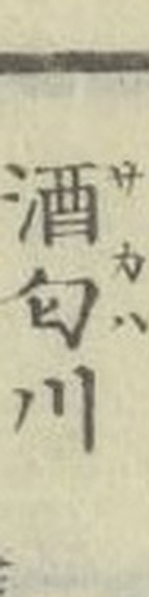酒匂川
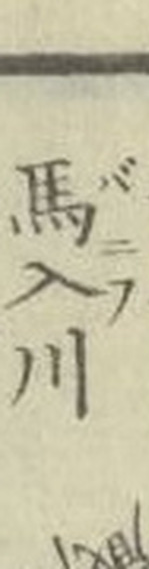馬入川
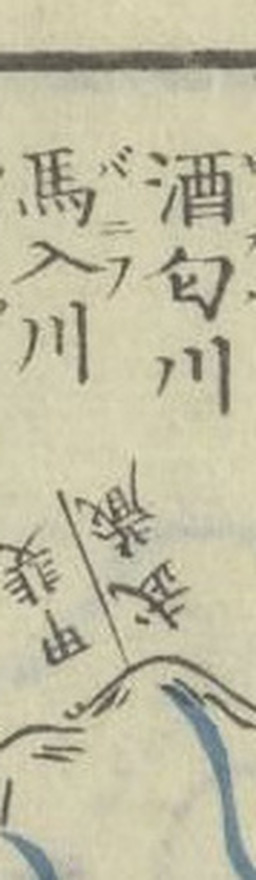馬入川
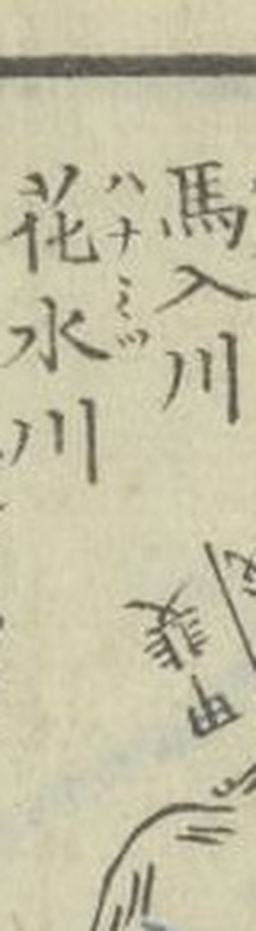花水川
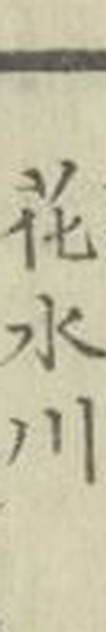花水川
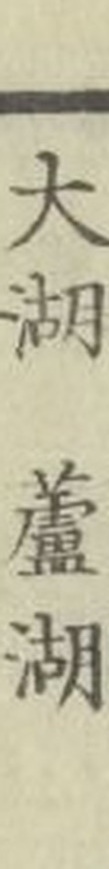大湖蘆湖
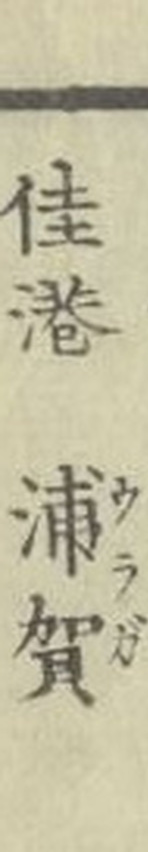佳港浦賀

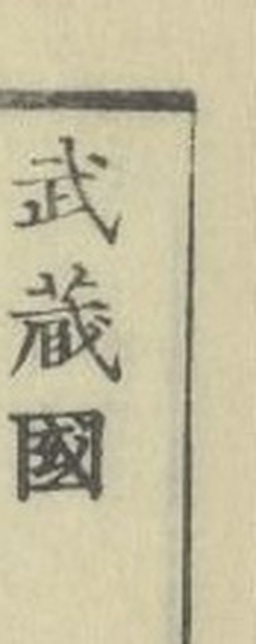武蔵國
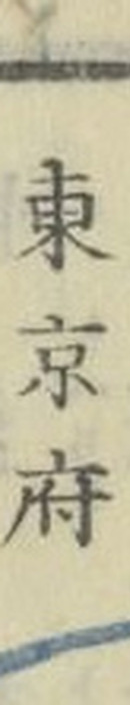東京府
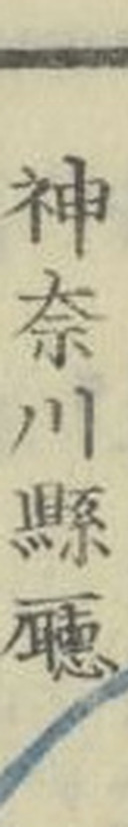神奈川縣㕔

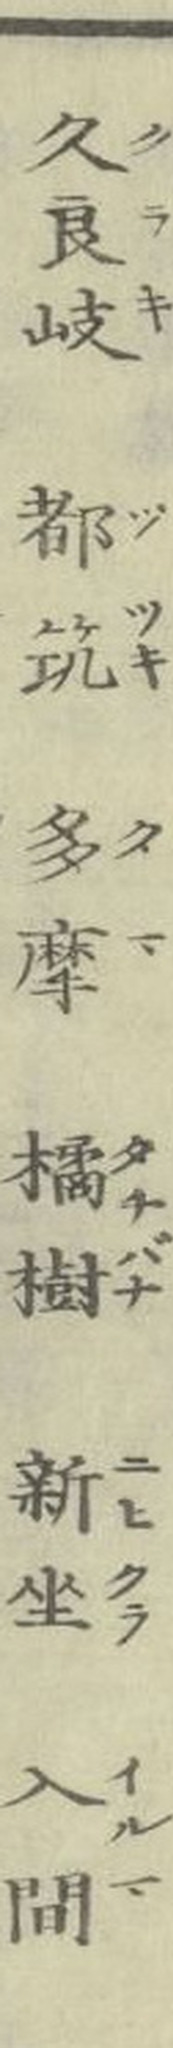久良岐都筑多摩橘樹新坐入間
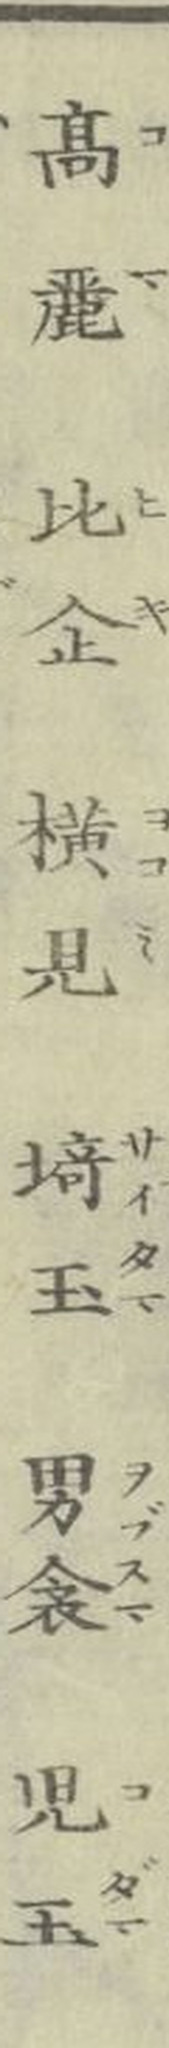髙䴡比企横見埼玉男衾児玉
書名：下等小学日本地誌略図問答 巻上 畿内東海道之部
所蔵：University of the Ryukyus Library
